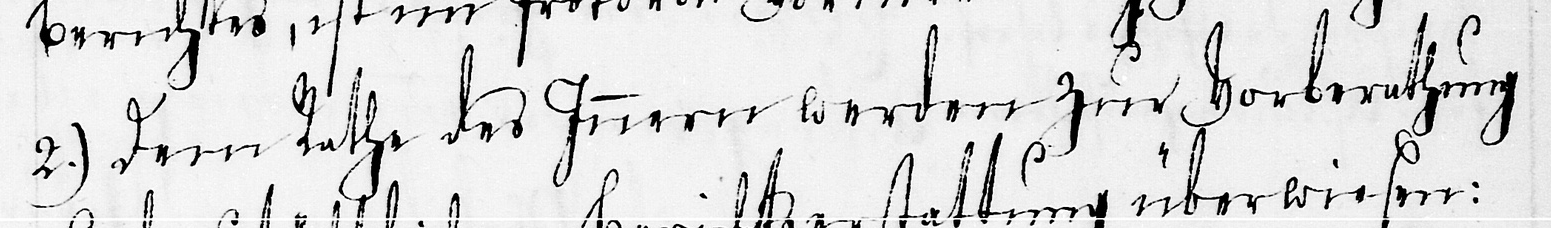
2.) Dem Rathe des Innern werden zur Vorberathung
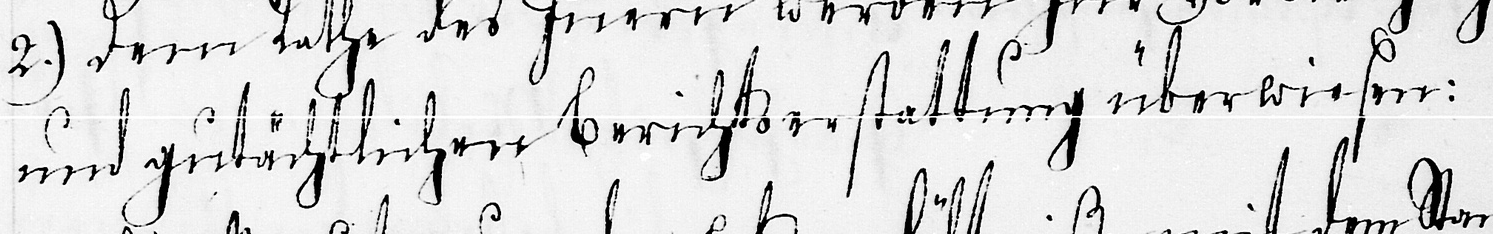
und gutächtlichen Berichtserstattung überwiesen:
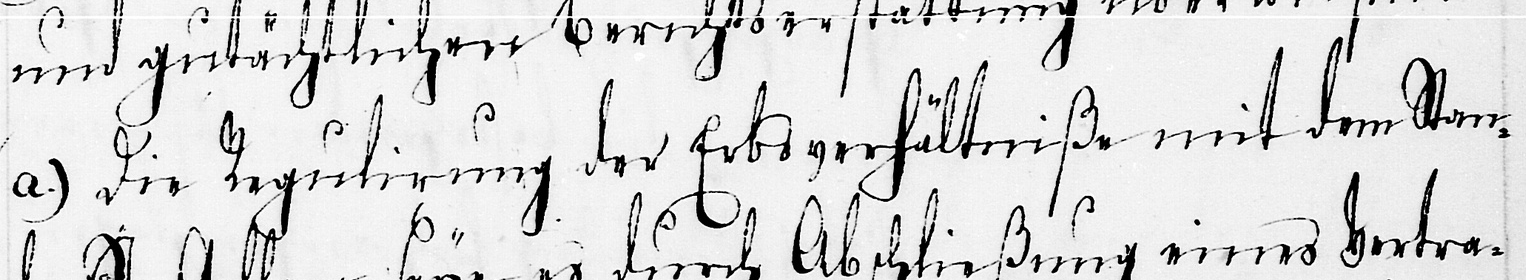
a.) Die Regulirung der Erbsverhältniße mit dem Stan¬
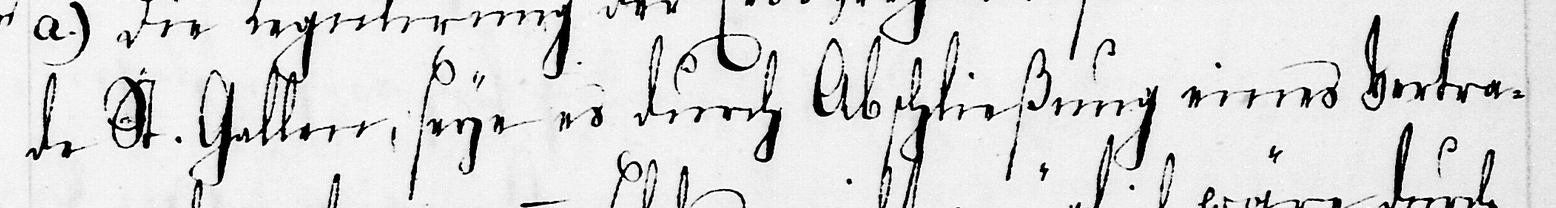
de St. Gallen, seye es durch Abschließung eines Vertra¬
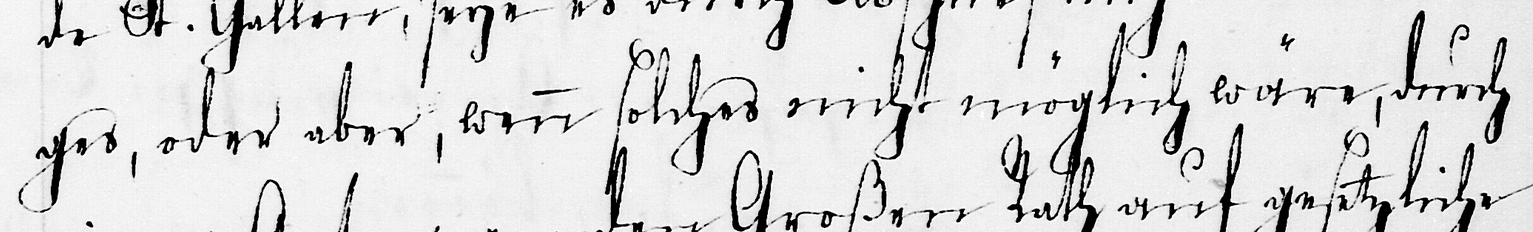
ges, oder aber, wenn solches nicht möglich wäre, durch
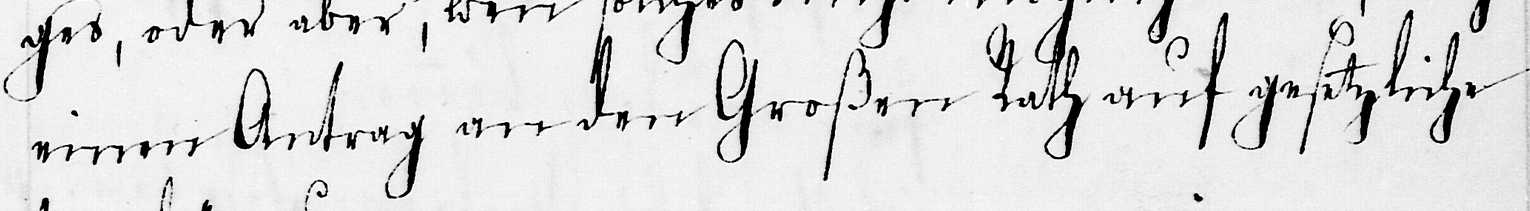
einen Antrag an den Großen Rath auf gesetzliche
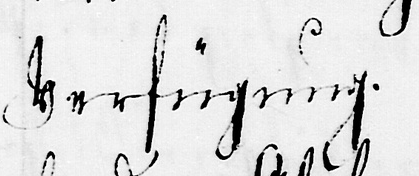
Verfügung.
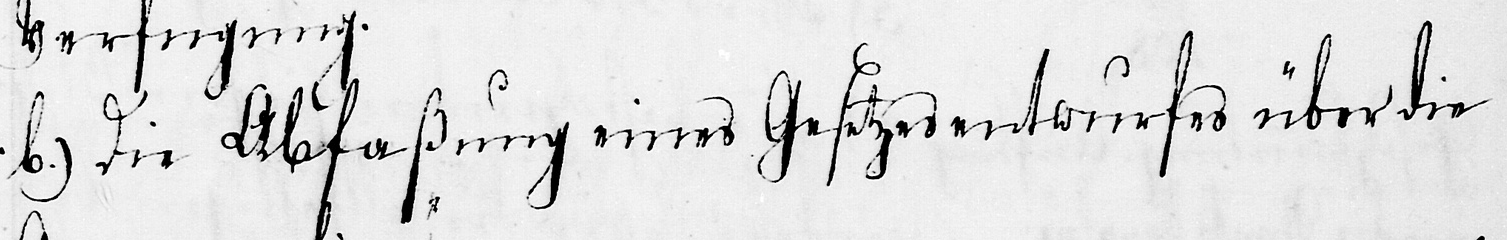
b.) Die Abfaßung eines Gesetzesentwurfes über die
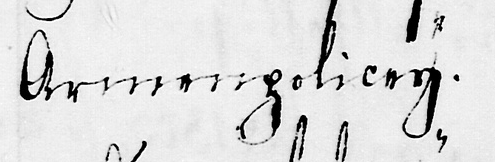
Armenpolicey.
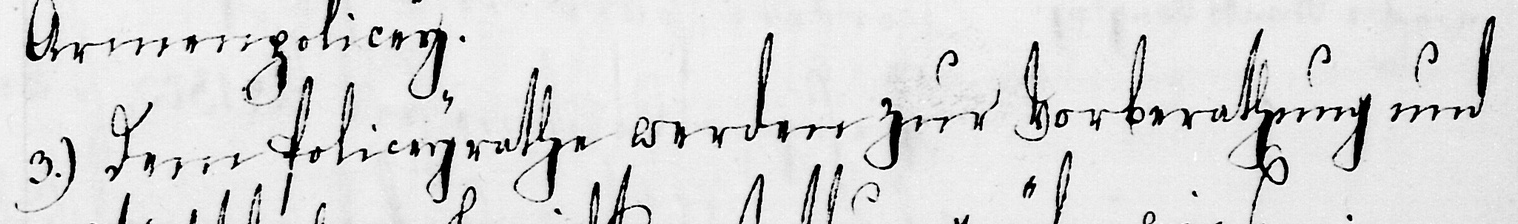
3.) Dem Policeyrathe werden zur Vorberathung und
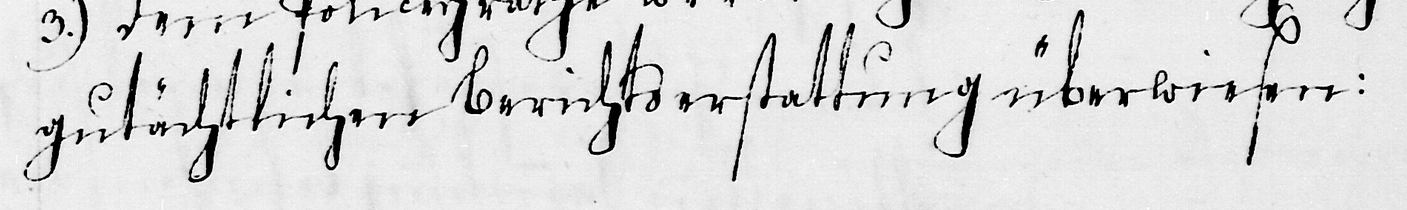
gutächtlichen Berichtserstattung überwiesen:
